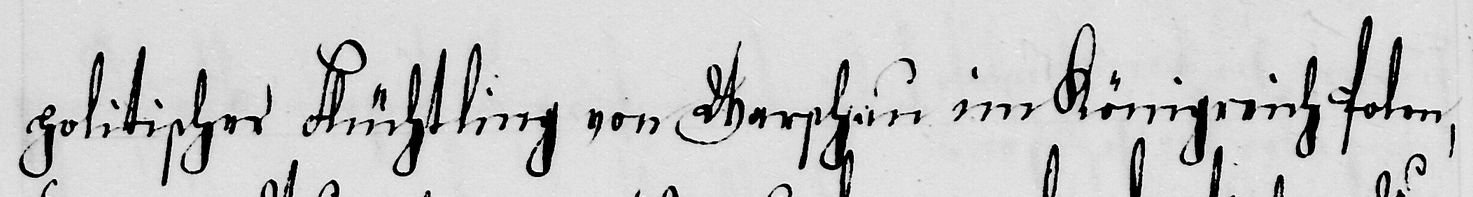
politischer Flüchtling von Warschau im Königreich Polen,
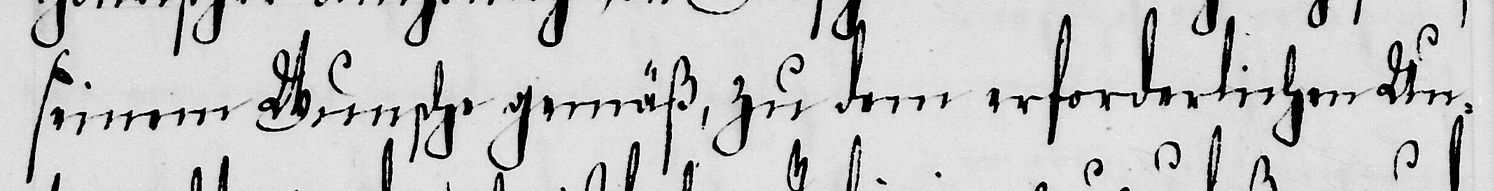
seinem Wunsche gemäß, zu dem erforderlichen Un¬
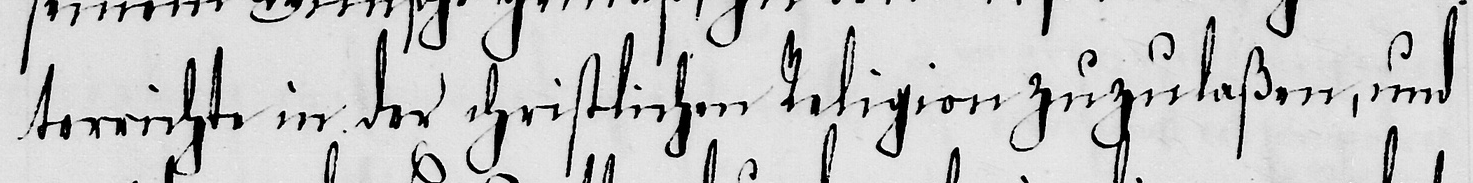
terrichte in der christlichen Religion zuzulaßen, und
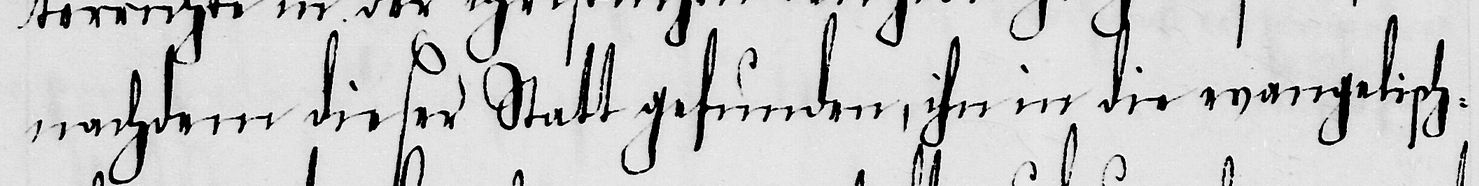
nachdem dieser Statt gefunden, ihn in die evangelisc¬
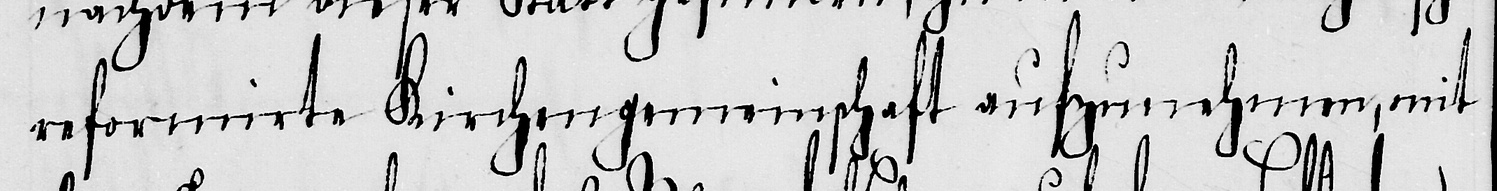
eformirte Kirchengemeinschaft aufzunehmen, mit
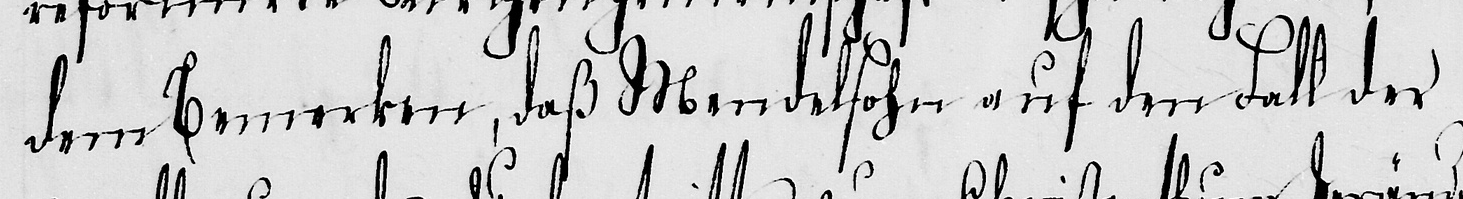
dem Bemerken, daß Mendelsohn auf den Fall der
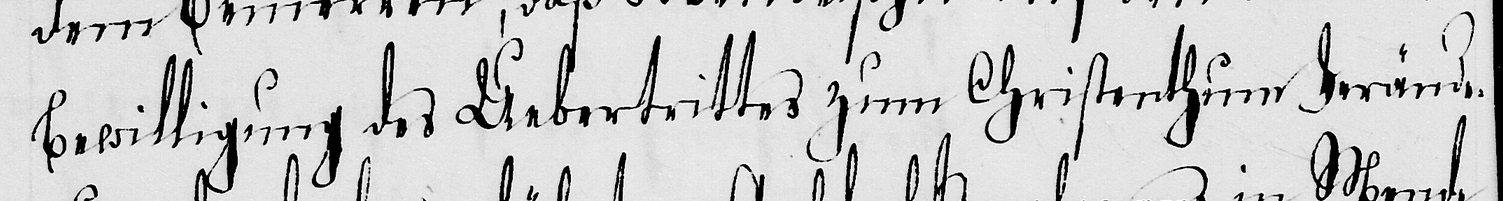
Bewilligung des Uebertrittes zum Christenthum Verände¬
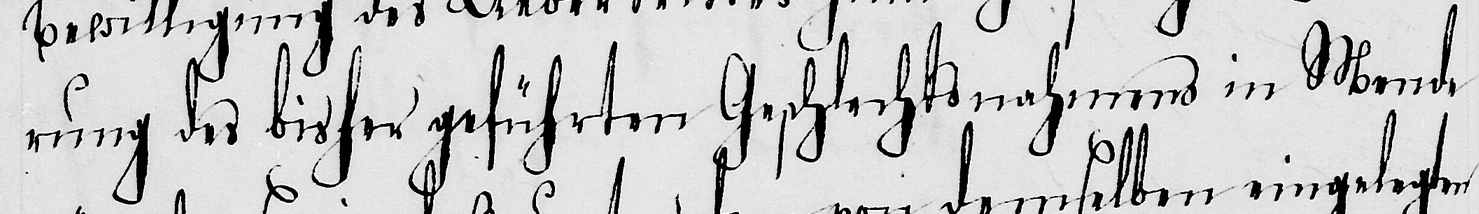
rung des bisher geführten Geschlechtsnahmens in Mende
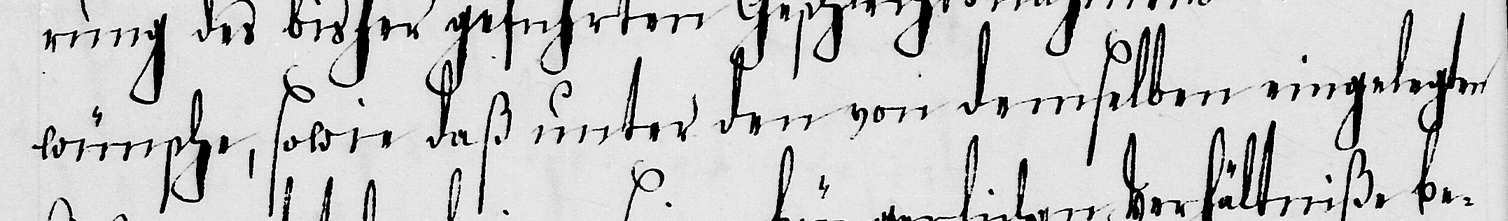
wünsche, sowie daß unter den von demselben eingelegten
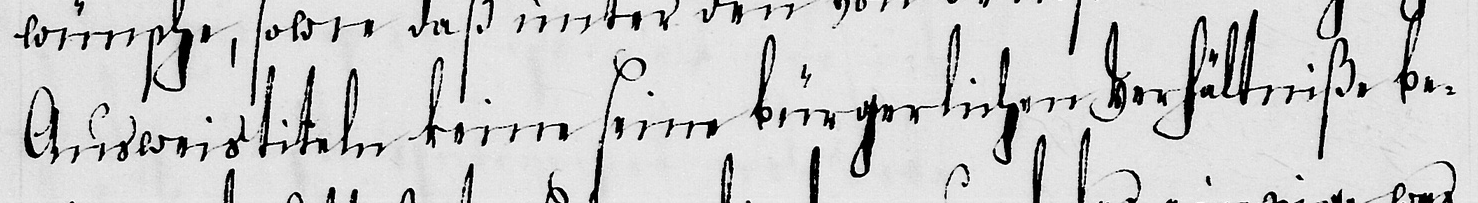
Ausweistiteln keine seine bürgerlichen Verhältniße be¬
